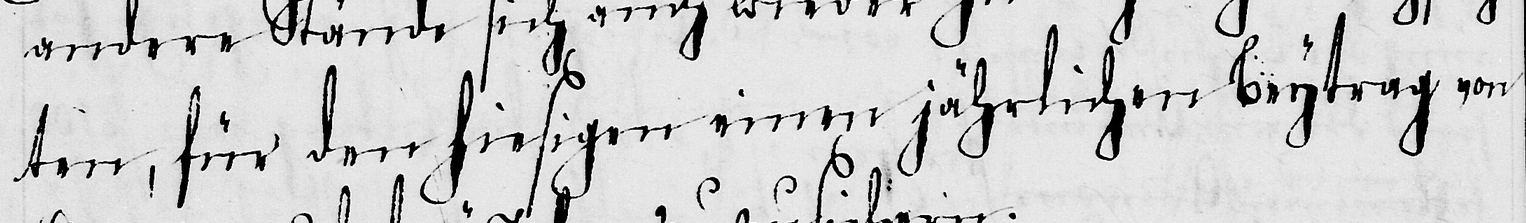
hten, für den hiesigen einen jährlichen Beytrag von
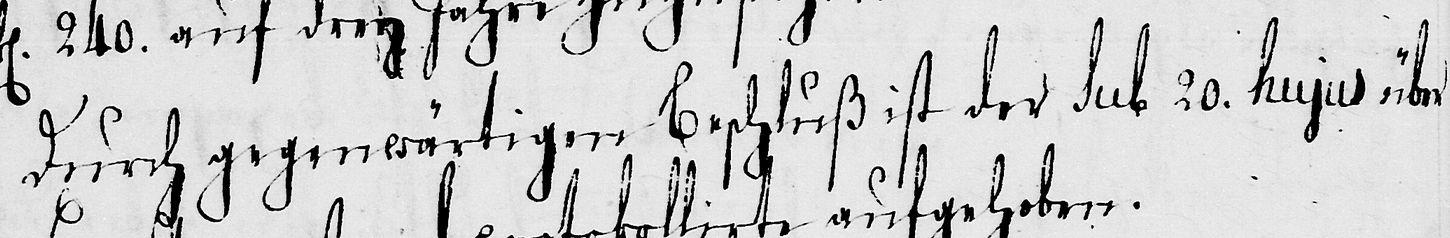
Durch gegenwärtigen Beschluß ist der sub 20. hujus üb¬
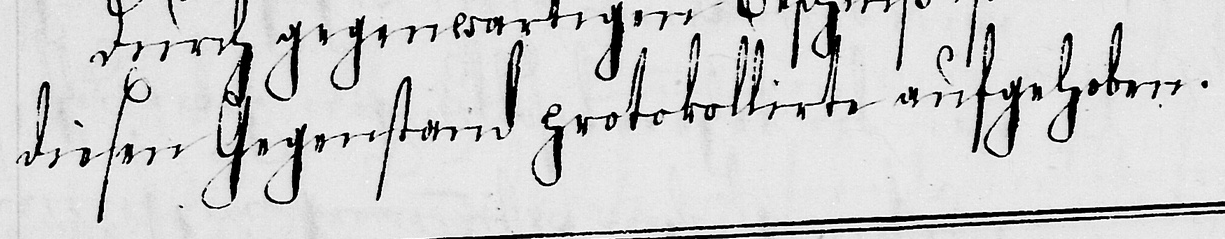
diesen Gegenstand protokollirte aufgehoben.
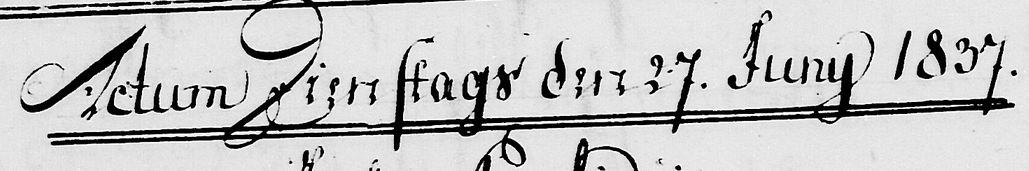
Actum Dienstags den 27. Juny 1837.
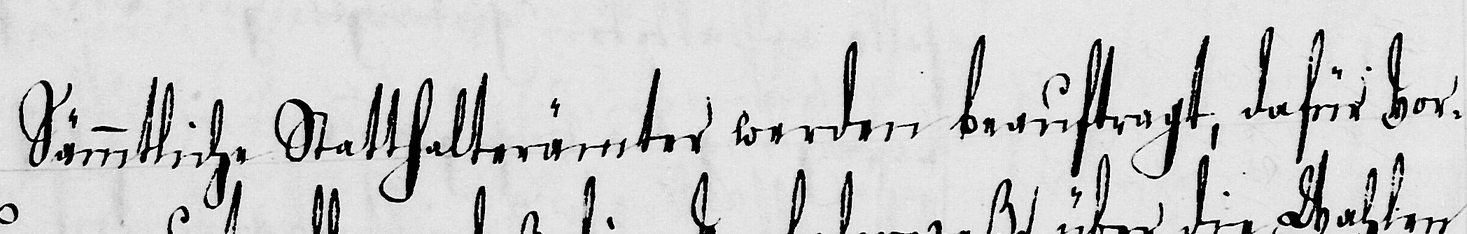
Sämmtliche Statthalterämter werden beauftragt, dafür Vor¬
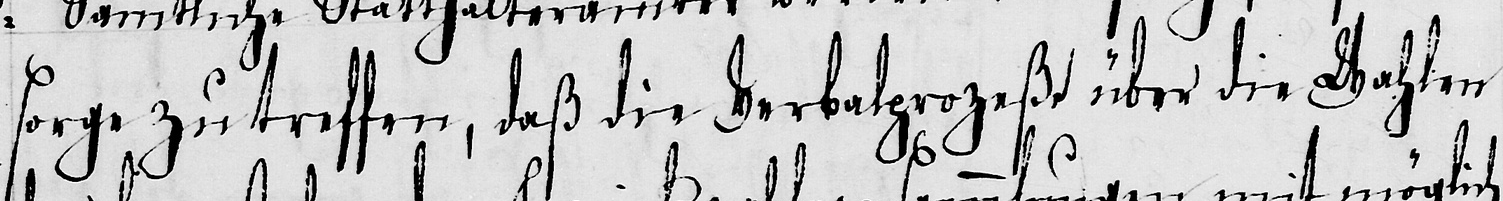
sorge zu treffen, daß die Verbalprozeße über die Wahlen
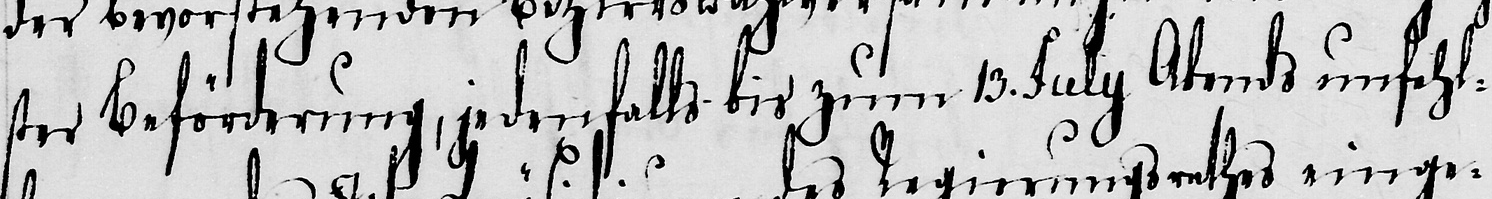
ster Beförderung, jedenfalls bis zum 13. July Abends unfehl¬
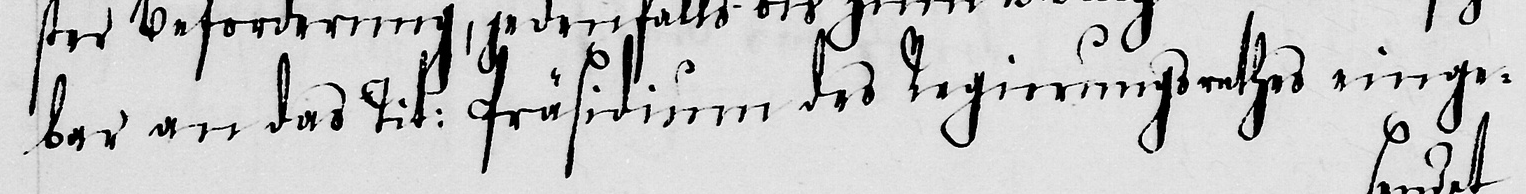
bar an das Tit: Präsidium des Regierungsrathes einge-
